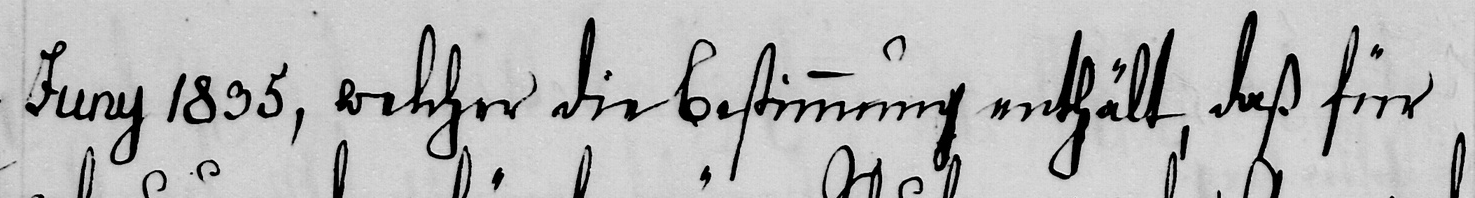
Juny 1835, welcher die Bestimmung enthält, daß für
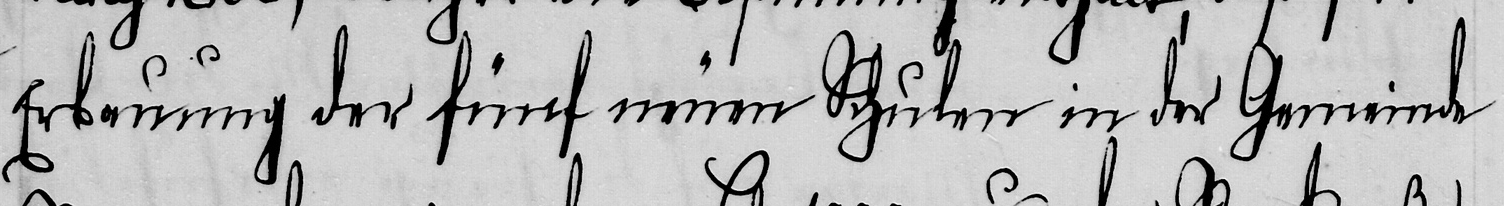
Erbauung der fünf neuen Schulen in der Gemeinde
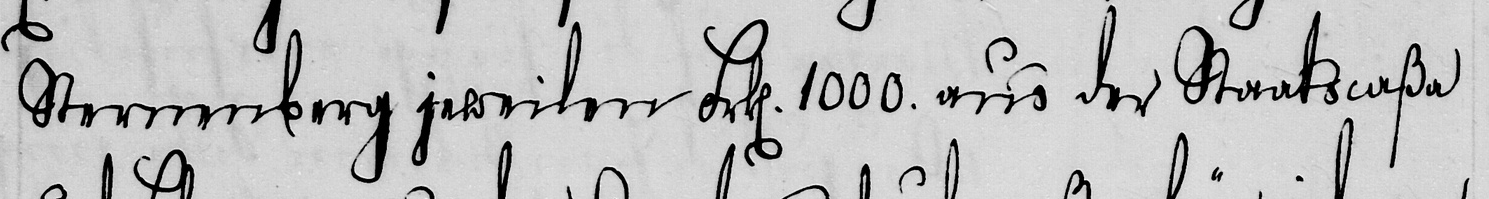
Sternenberg jeweilen Frk[en]. 1000. aus der Staatscaßa
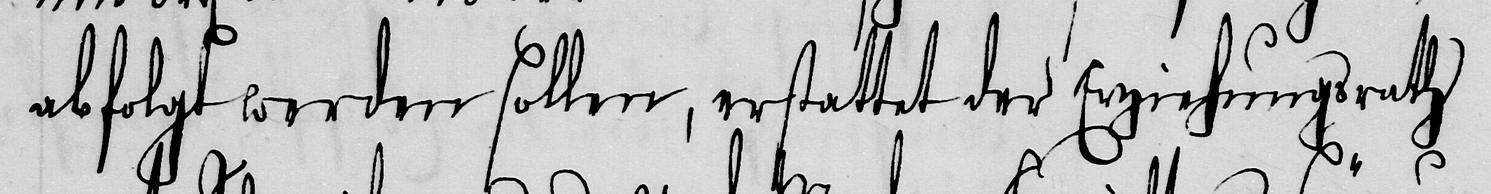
abfolgt werden sollen, erstattet der Erziehungsrath
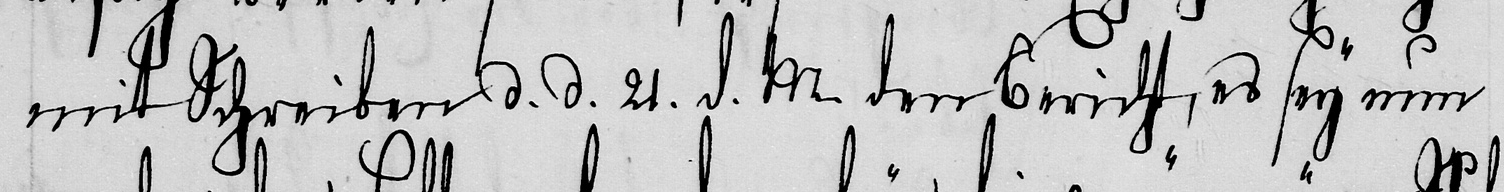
mit Schreiben d. d. 21. d. M. den Bericht, es sey nun
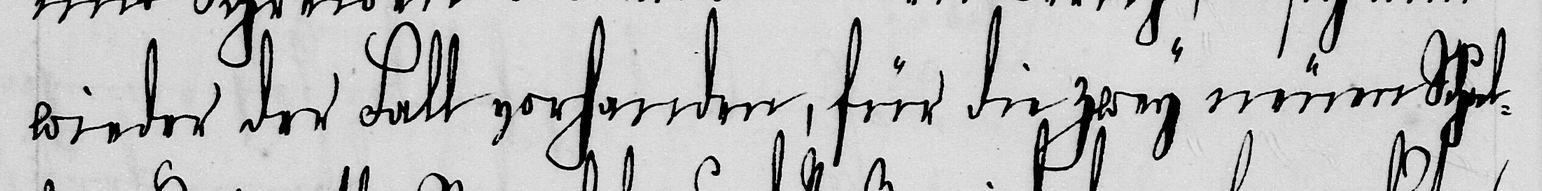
wieder der Fall vorhanden, für die zwey neuen Schu¬
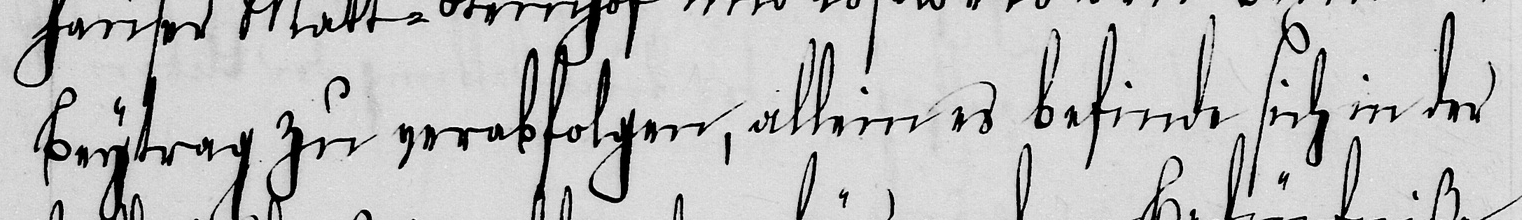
Beytrag zu verabfolgen, allein es befinde sich in der
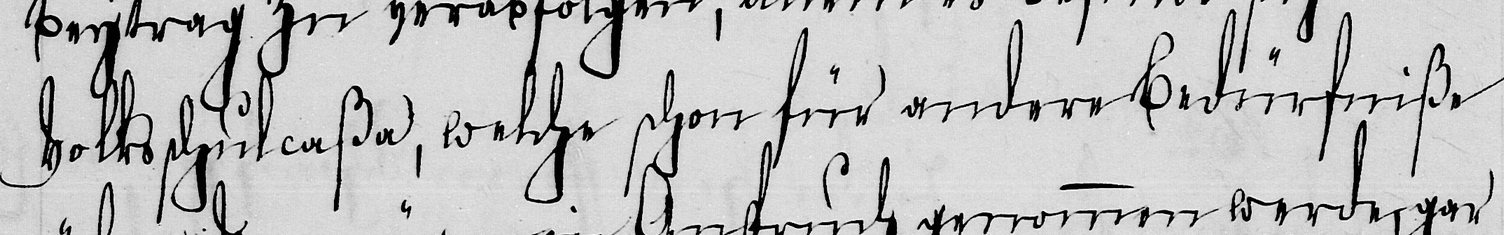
Volksschulcaßa, welche schon für andere Bedürfniße
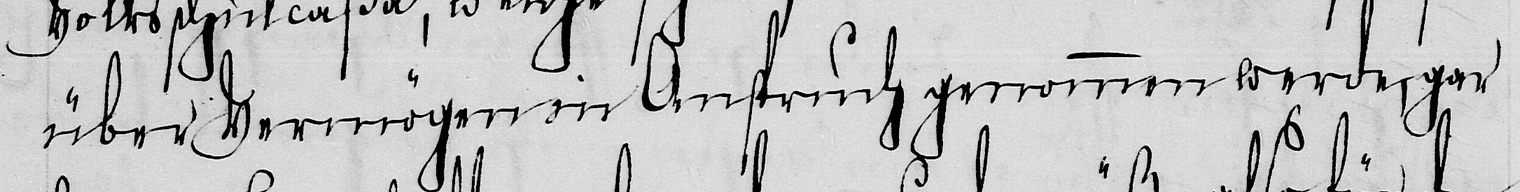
über Vermögen in Anspruch genommen werde, gar
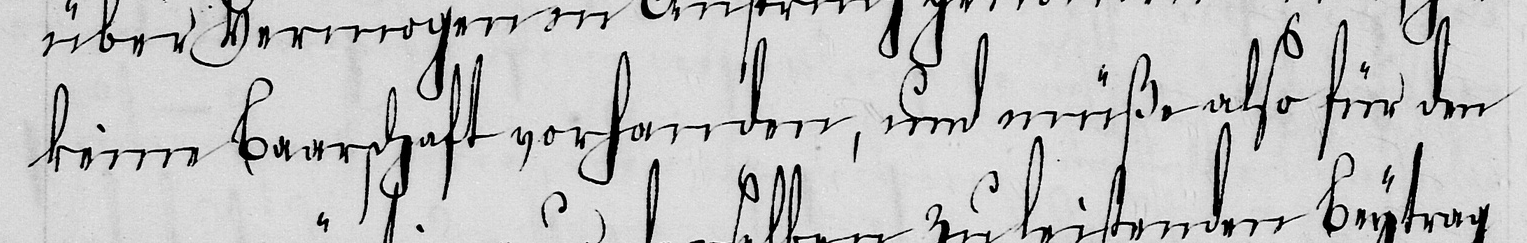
keine Baarschaft vorhanden, und müße also für den
